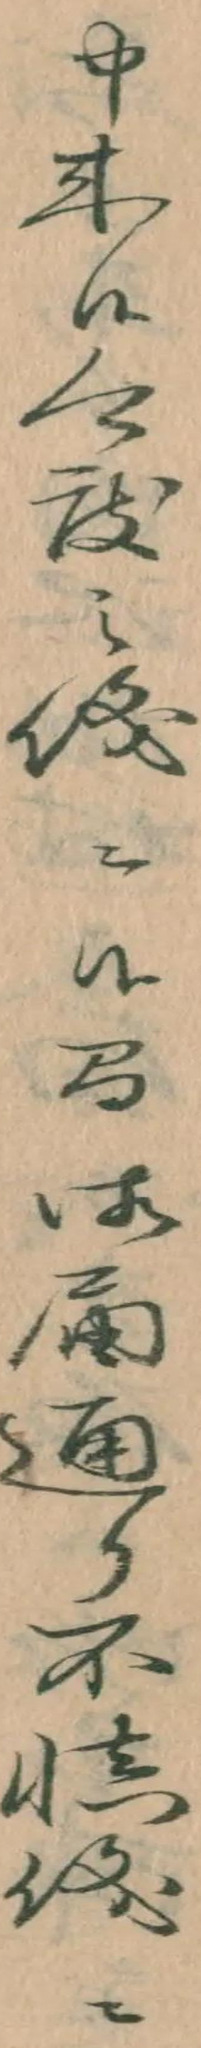申来候今度之儀に候間御届通り不慎儀に
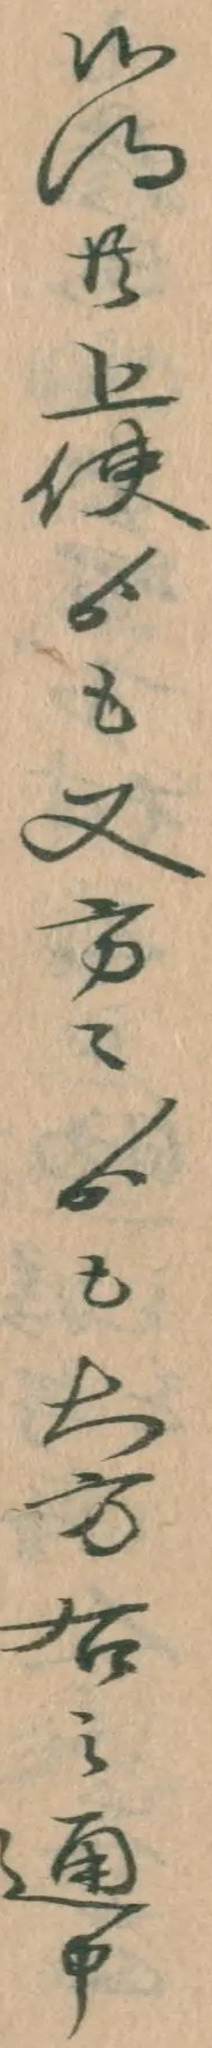候得共上使ゟも又方々ゟも大方右之通申
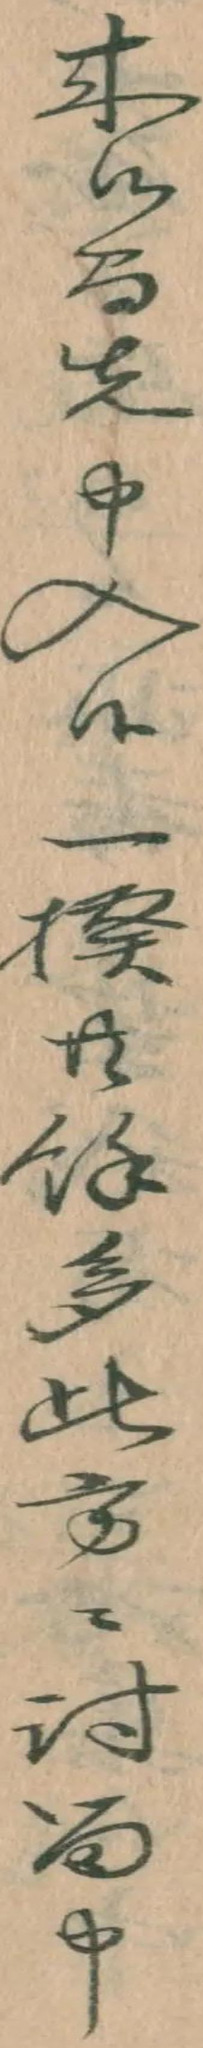来候間先申入候一揆共余多此方に討留申
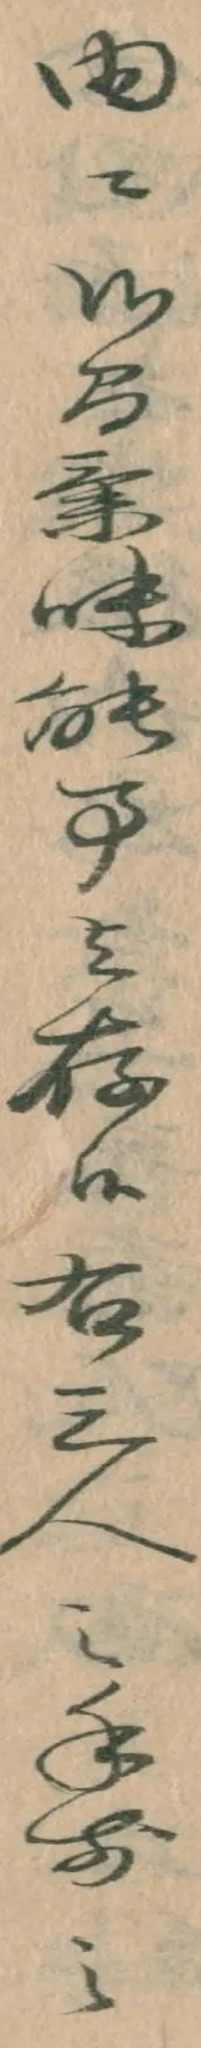由に候間気味能事与存候右三人之手前之
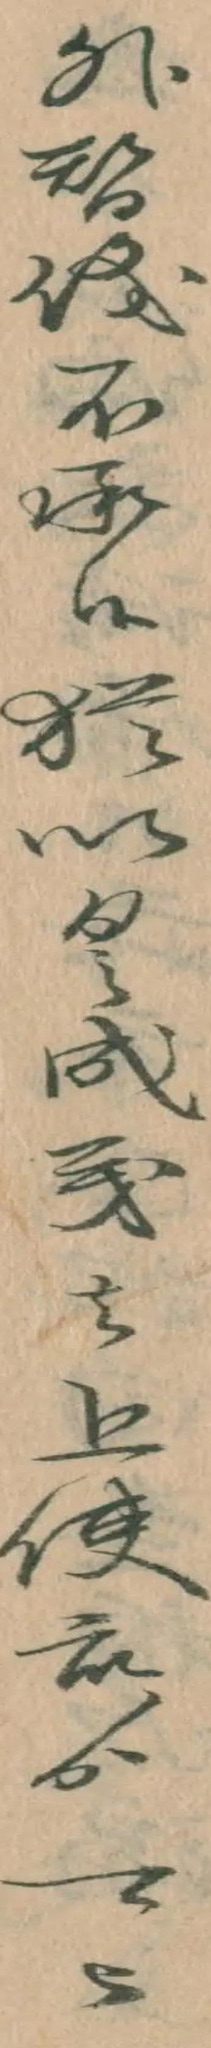外替儀不承候猶以具成義者上使衆ゟ可被
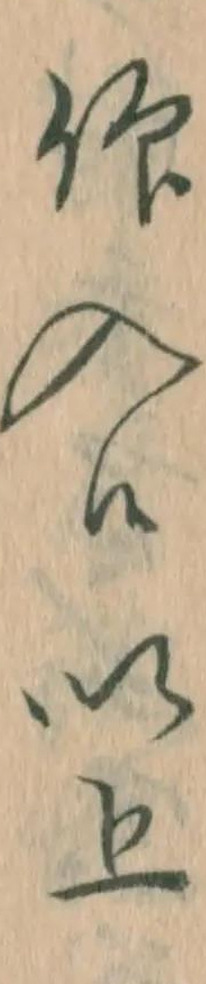仰入候以上
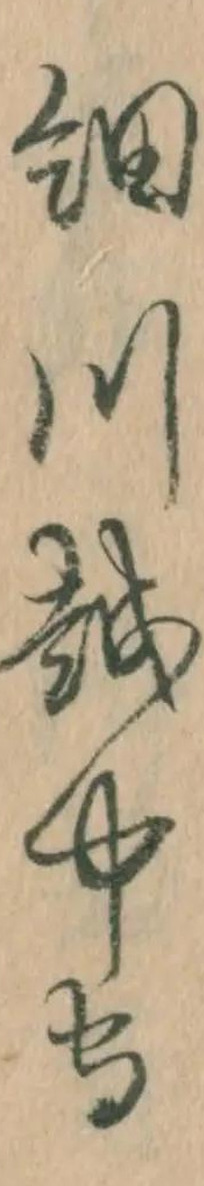細川越中守
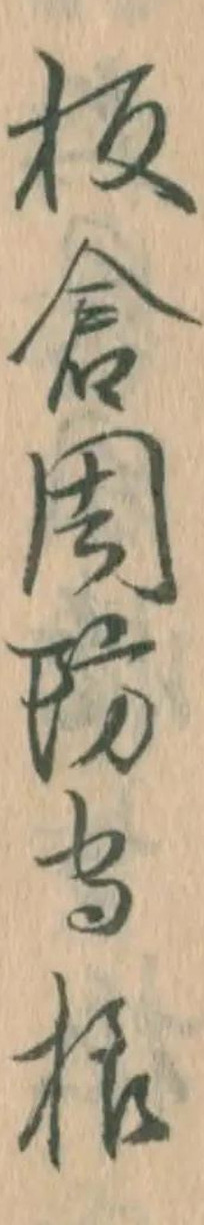板倉周防守様
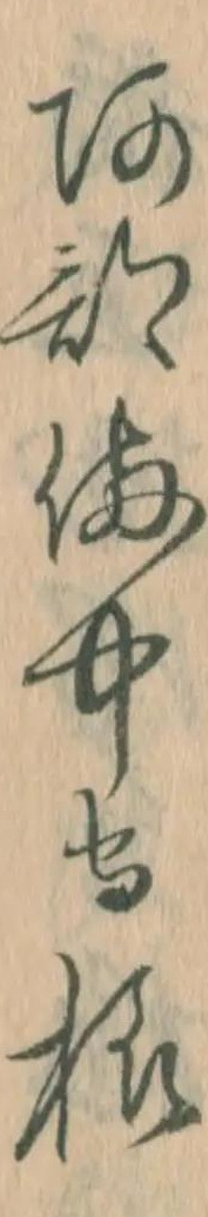阿部備中守様

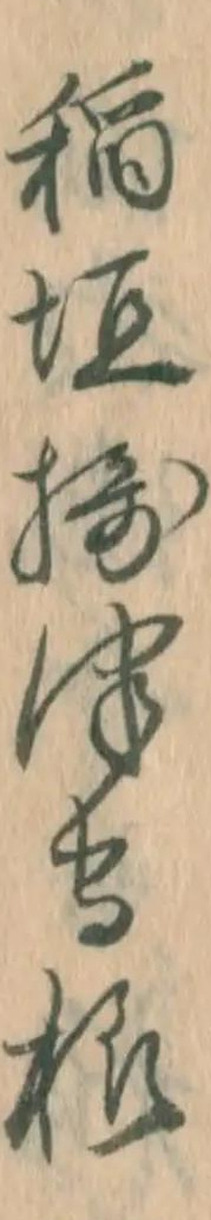稲垣摂津守様
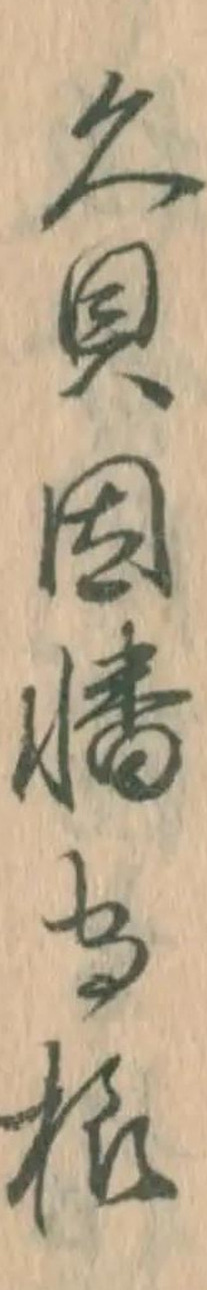久貝因幡守様
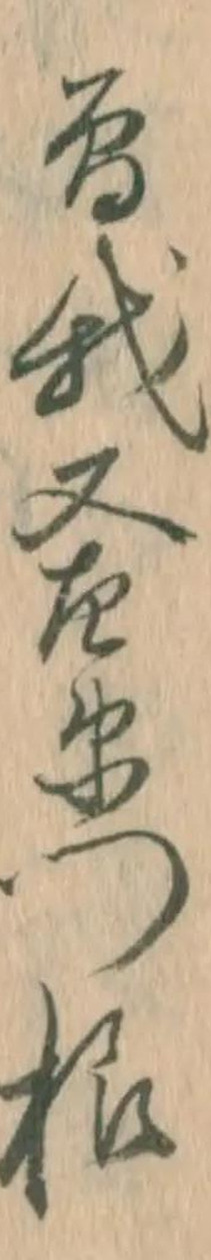曽我又左衛門様
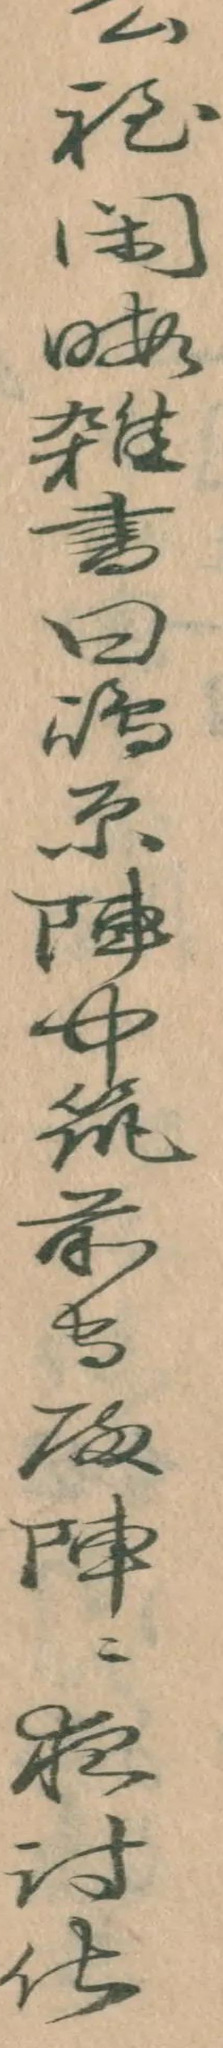公程閑暇雑書曰島原陣中筑前守殿陣に夜討仕
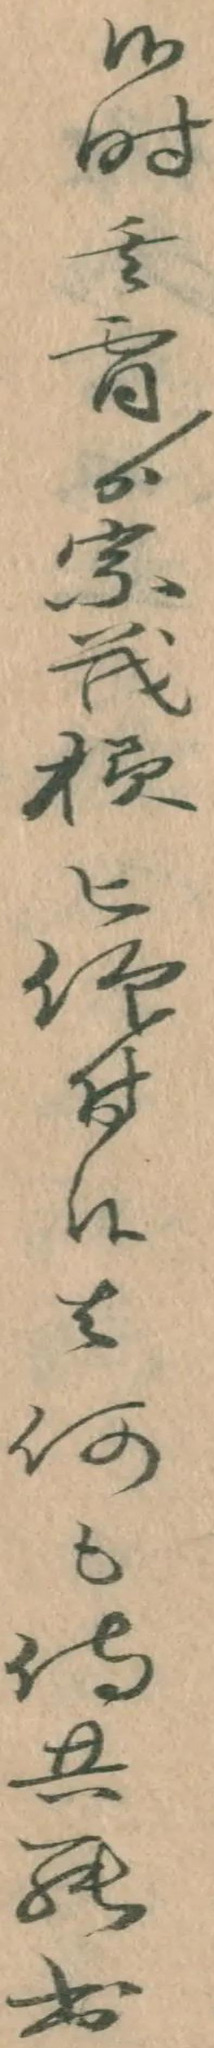候時其宵ゟ宗茂様被仰付候者何も侍共罷出
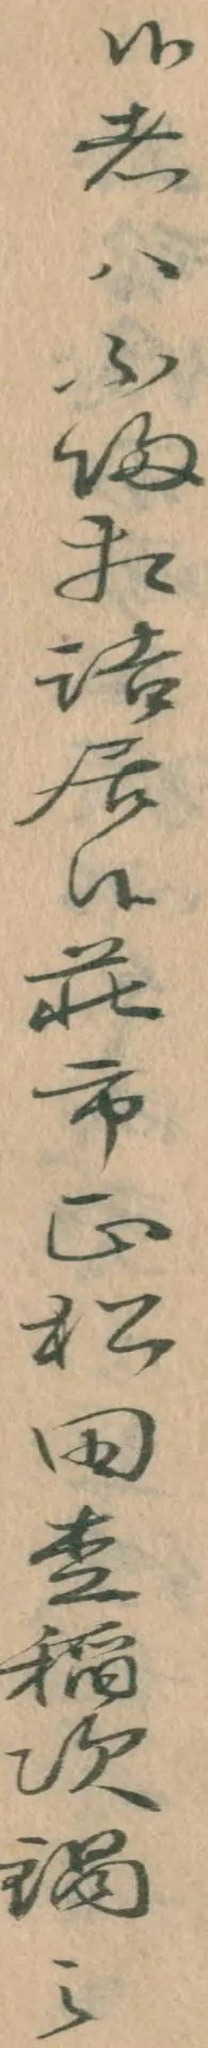候者は不帰相詰居候荘市正松田杢稲次鍋之
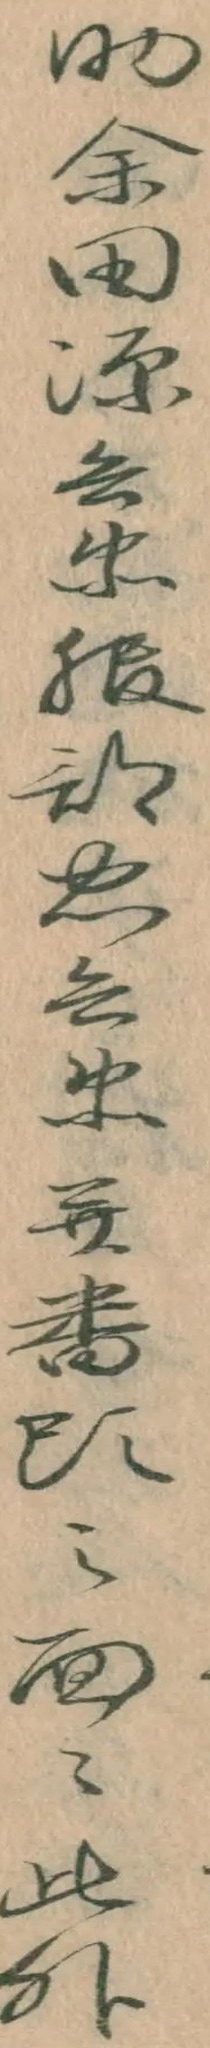助余田源兵衛服部忠兵衛幷番頭之面々此外
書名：切支丹御退治記 49巻. [7]
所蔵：国立国会図書館 National Diet Library, JAPAN
